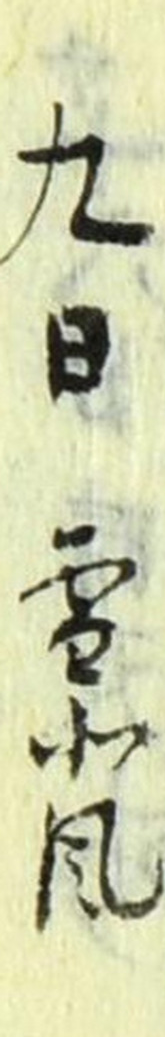六日雨北風

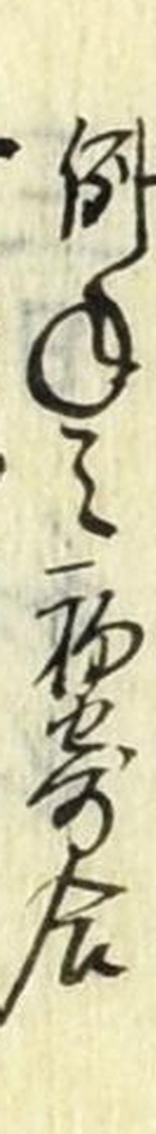例年之初寄合
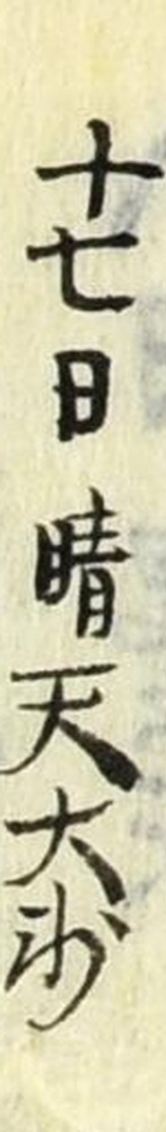十七日晴天大氷
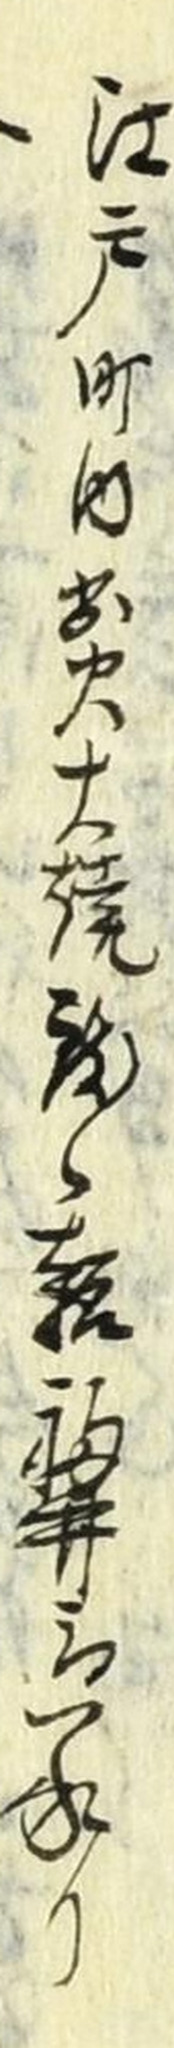江戸町内出火大焼致候趣福井ニ而承り
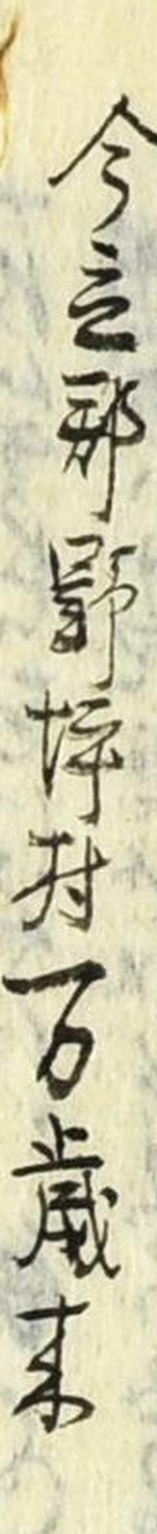今立郡野坪村万歳来
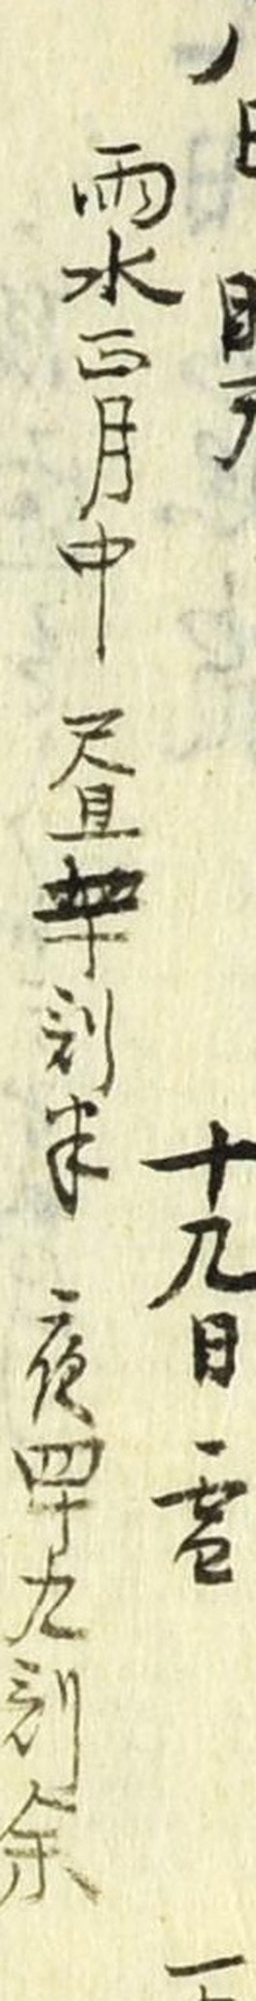雨水正月中昼五十刻半夜四十九刻余
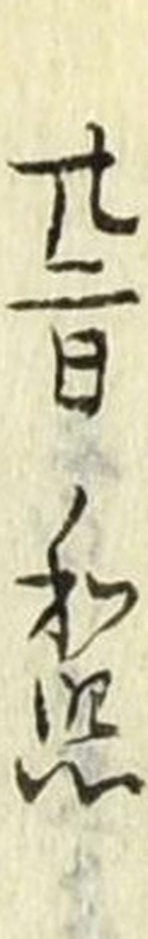廿四日和照
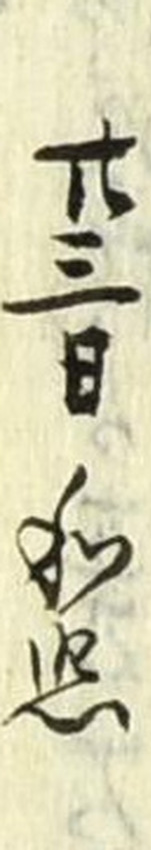廿四日和照
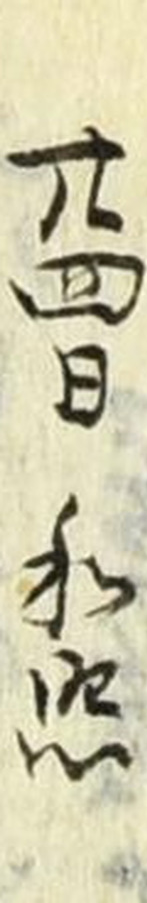廿四日和照
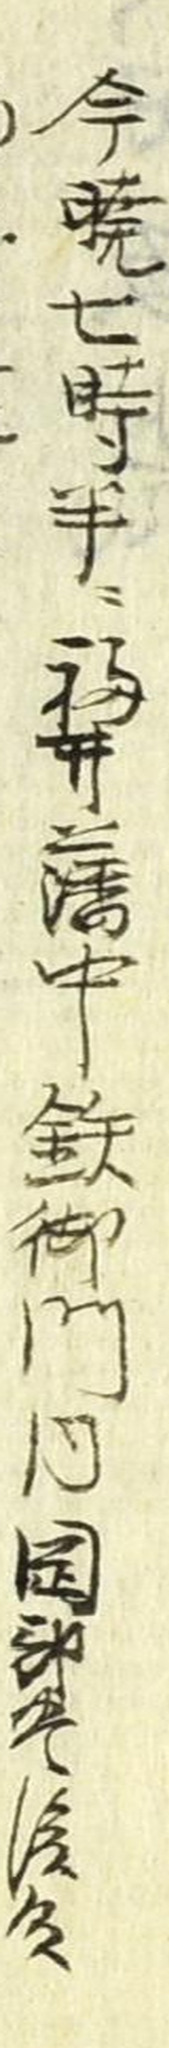今暁七時半ニ福井藩中鉄御門岡部豊後殿
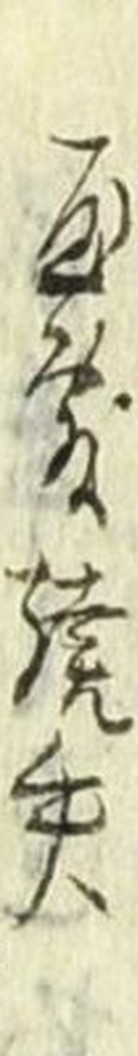屋敷焼失
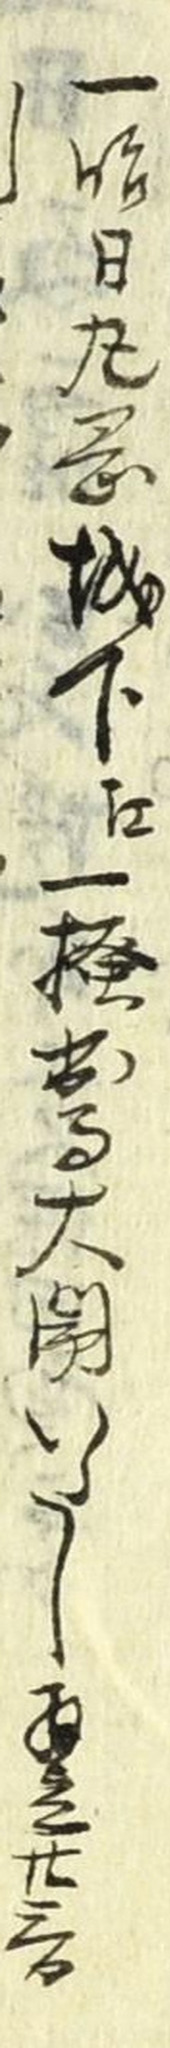一昨日丸岡城下江一揆出る大閙いたし翌廿三日
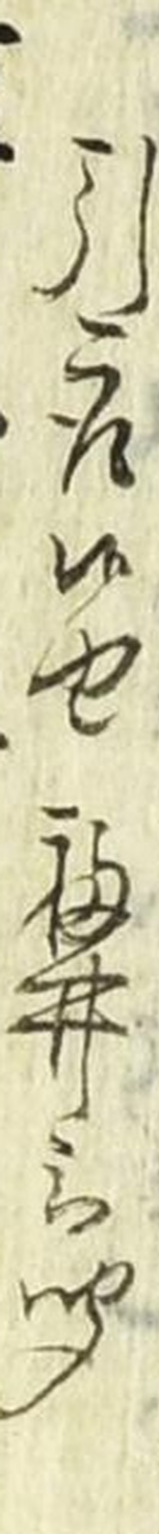引取候由福井ニ而聞
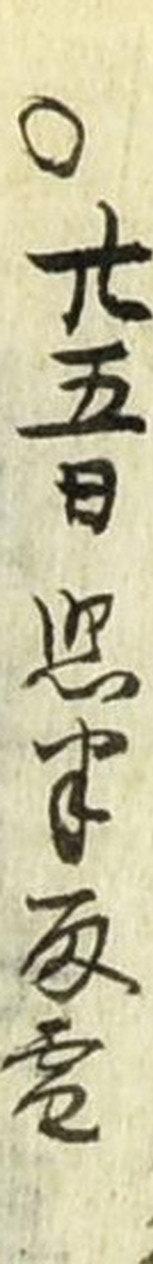○廿五日照半雨雪
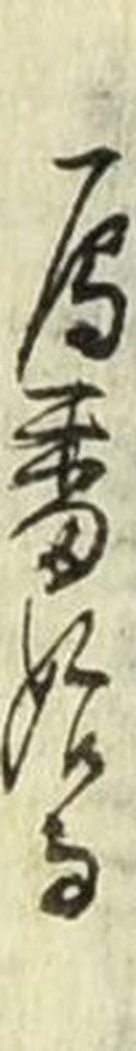雁番始る
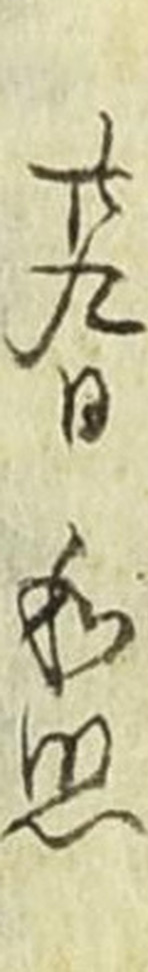廿九日和照
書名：（日記）
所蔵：福井県文書館 Fukui Prefectural Archives
